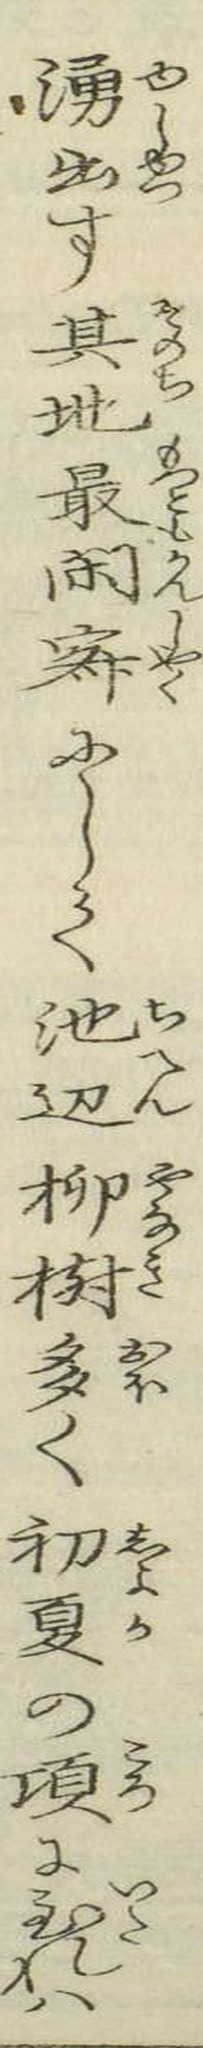湧出す其地最閑寂にして池辺柳樹多く初夏の頃に至れは
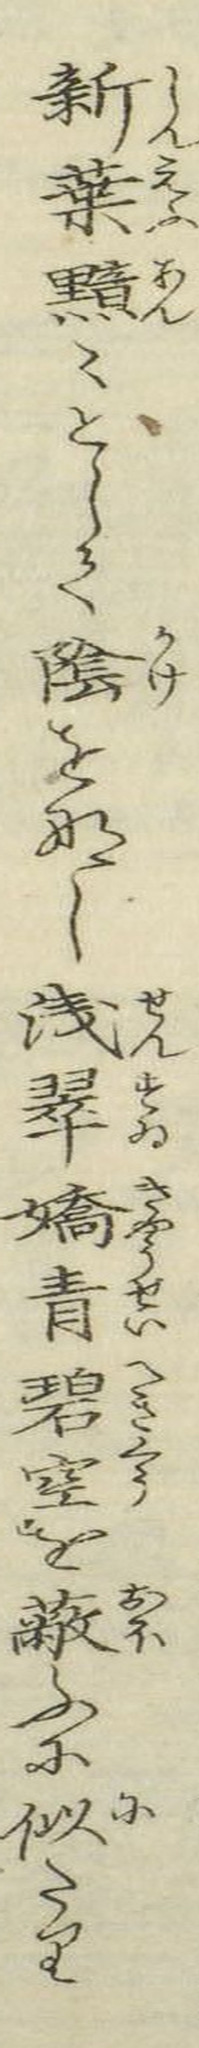新葉黯々として陰をなし浅翠嬌青碧空を蔽ふに似たり
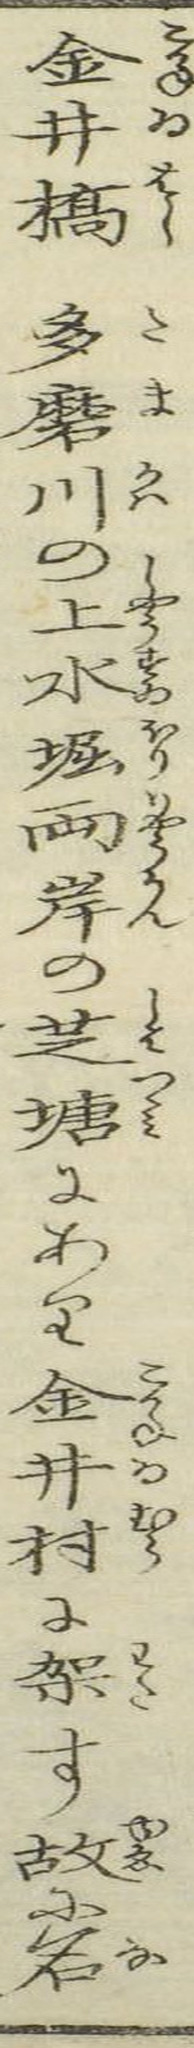金井橋多摩川の上水堀両岸の芝塘にあり金井村に架す故に名
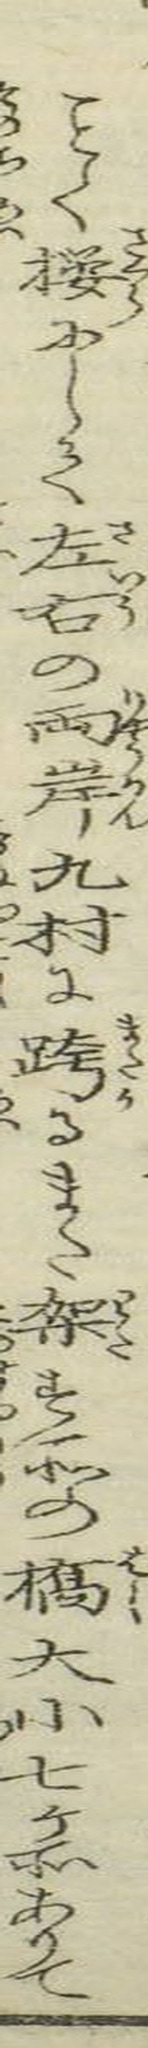ことく桜にして左右の両岸九村に跨るまた架す所の橋大小七ケ所ありて
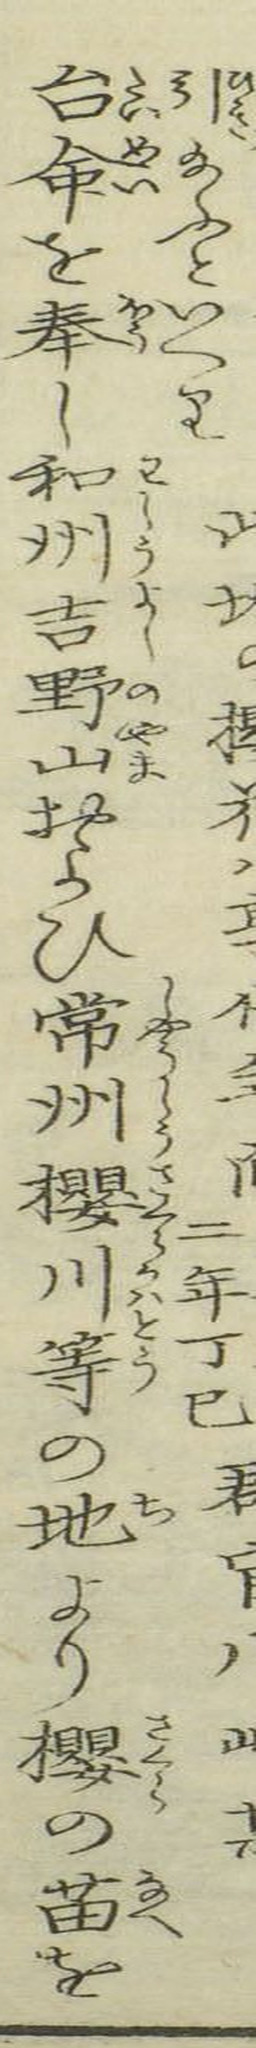台命を奉し和州吉野山およひ常州桜川等の地より桜の苗を

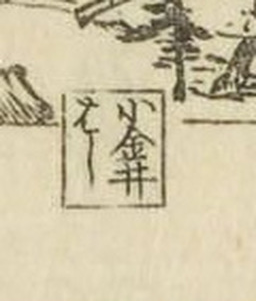小金井

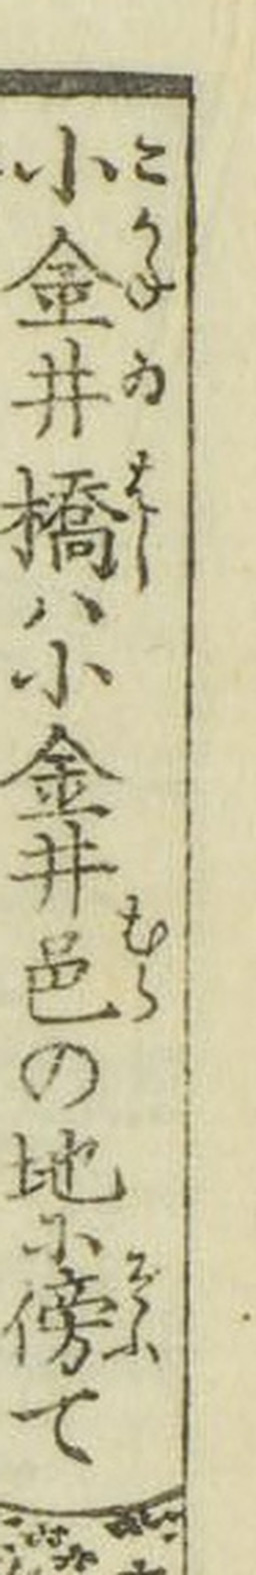小金井橋は小金井邑の地に傍て
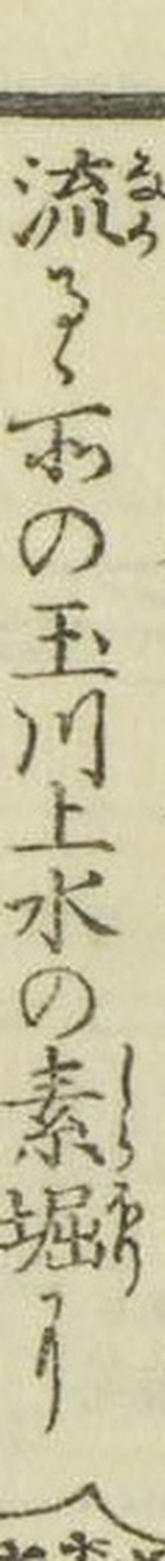流るゝ所の玉川上水の素堀に
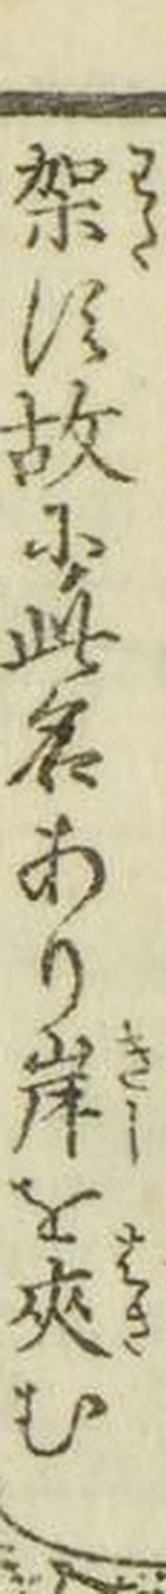架す故に此名あり岸を夾む
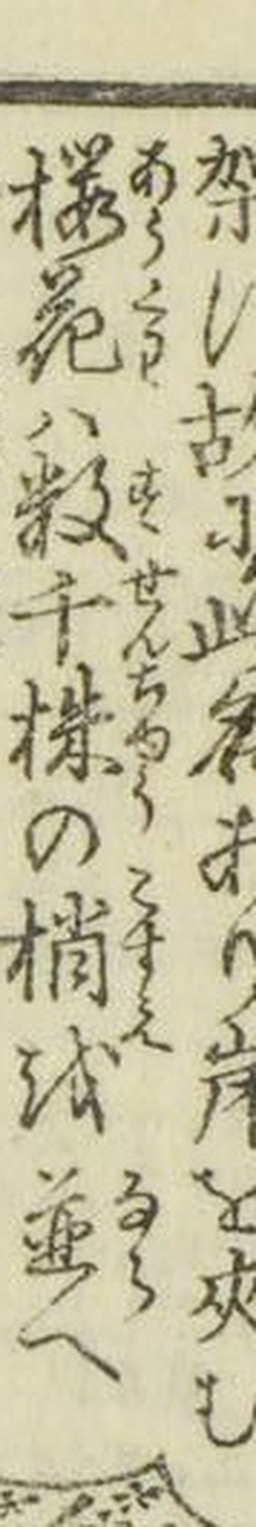桜花は数千株の梢を並へ
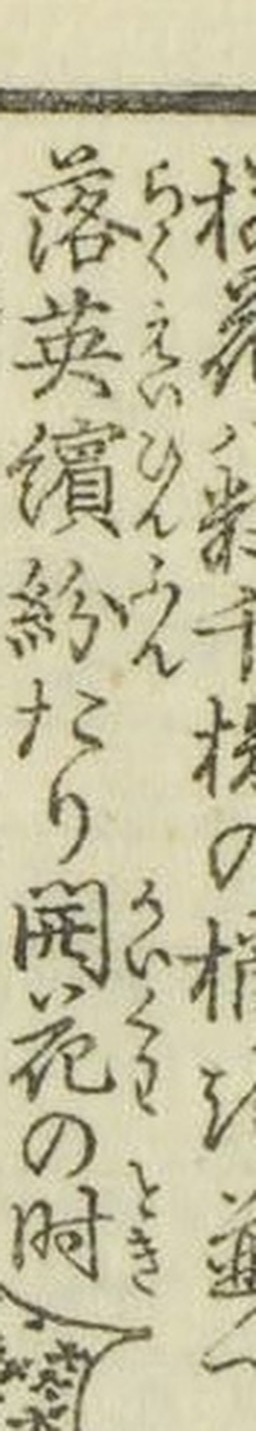落英繽紛たり開花の時
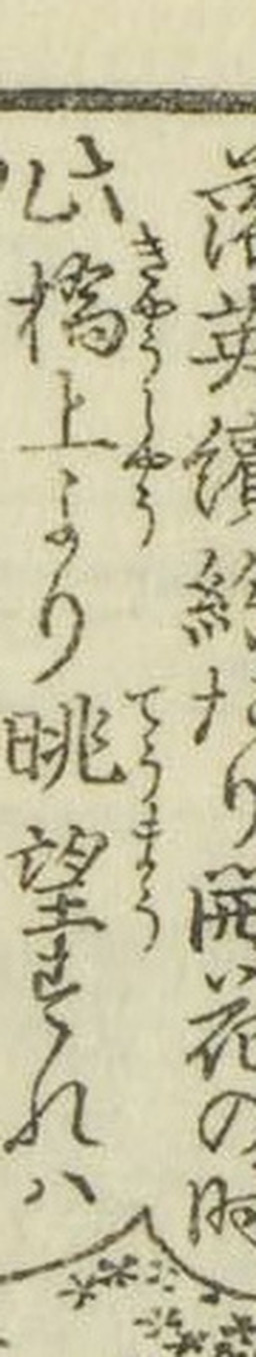此橋上より眺望すれは
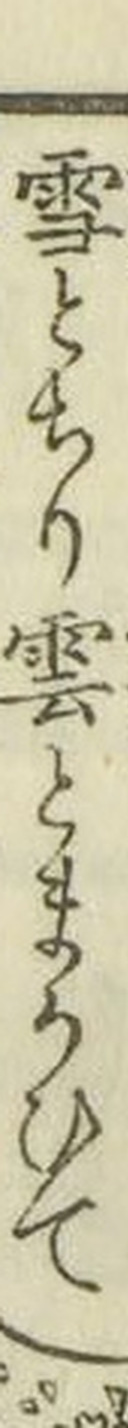雪とちり雲とまかひて
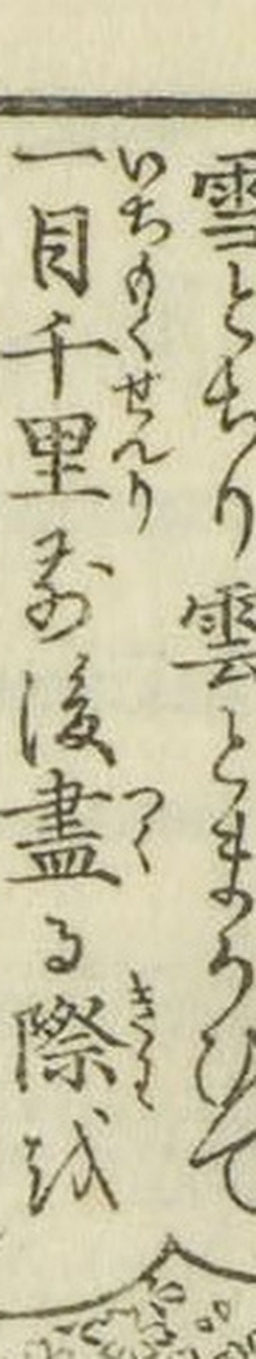一目千里前後尽る際を
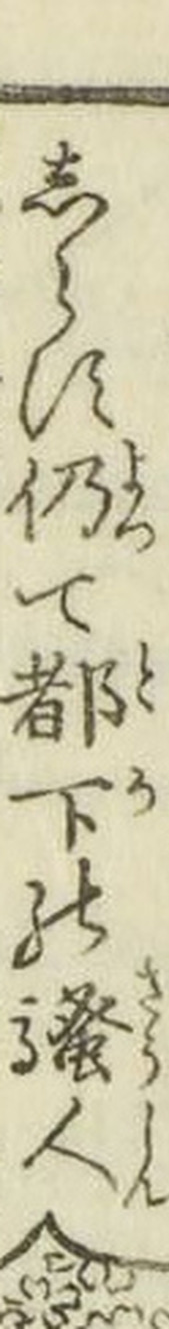しらす仍て都下の騒人
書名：江戸名所図会 20巻 巻之11
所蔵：東京学芸大学教育コンテンツアーカイブ
